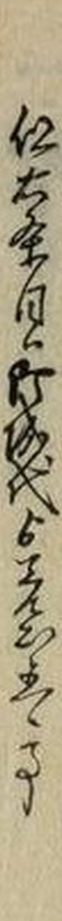但右条目ハ御城代ゟ差出置候事
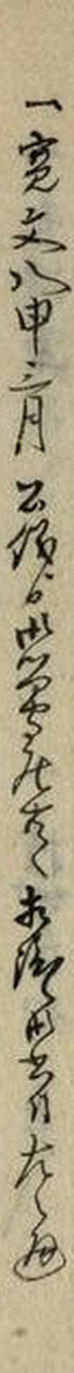一寛文八申三月公儀ゟ御留守居共へ相渡候御書付左之通
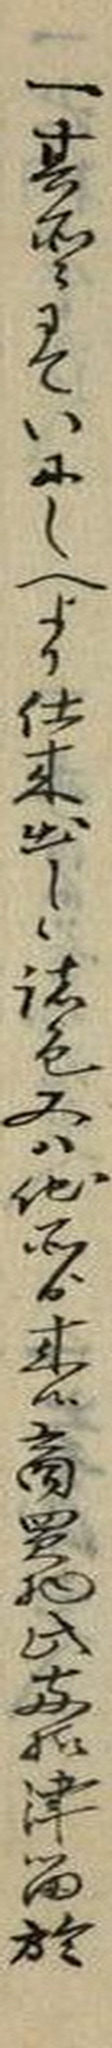一其所々にていにしへより仕来出し候諸色又ハ他国ゟ来候商買物此両様津留於
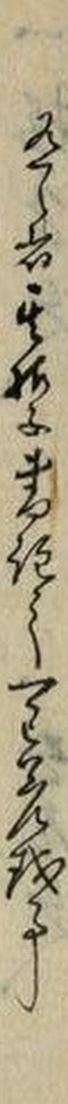有之者其様子書記之可被差越事
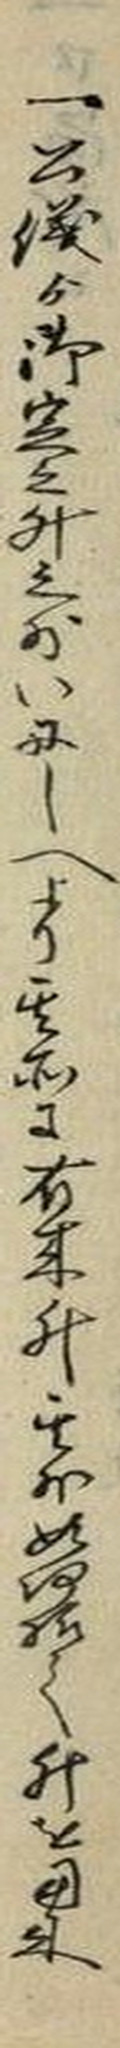一公儀ゟ御定之升之外いにしへより其所に有来升其外如何様之升を用来
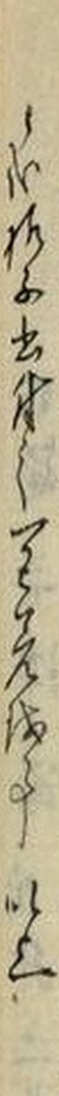候哉様子書付之可被差越事以上
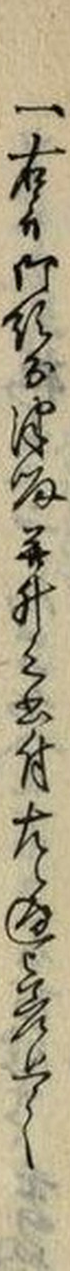一右ニ付御領分津留幷升之書付左之通被差上之
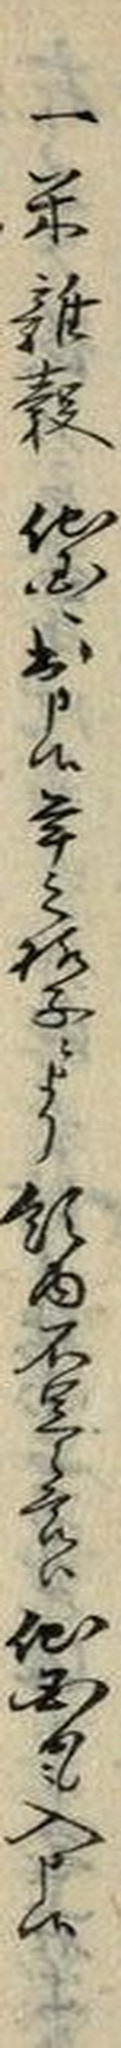一米雑穀他国へ出申候年之様子ニより領内不足之節ハ他国ゟも入申候
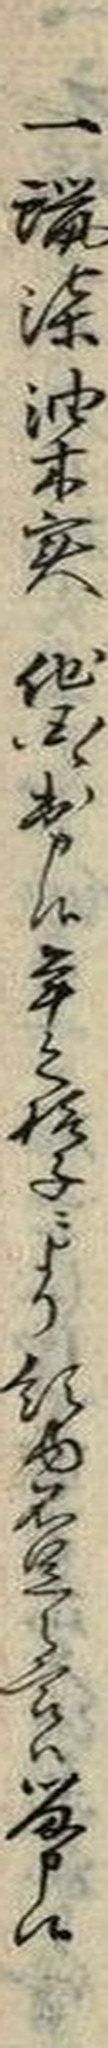一蝋漆油木実他国へ出申候年之様子ニより領内不足之節ハ留申候
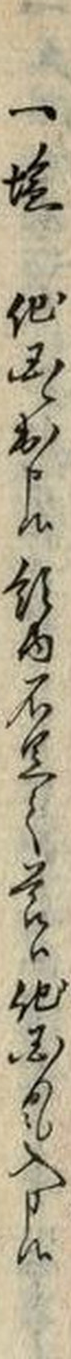一塩他国へ出申候領内不足之節ハ他国ゟも入申候
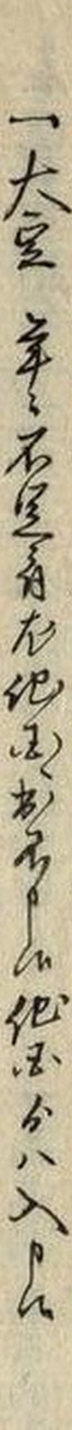一大豆年々不足ニ付尤他国へ出不申候他国ゟハ入申候
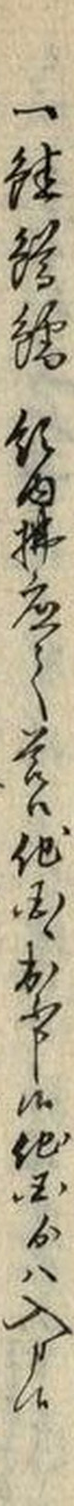一鮭鱒鱈領内払底之節ハ他国へ出不申候他国ゟハ入申候
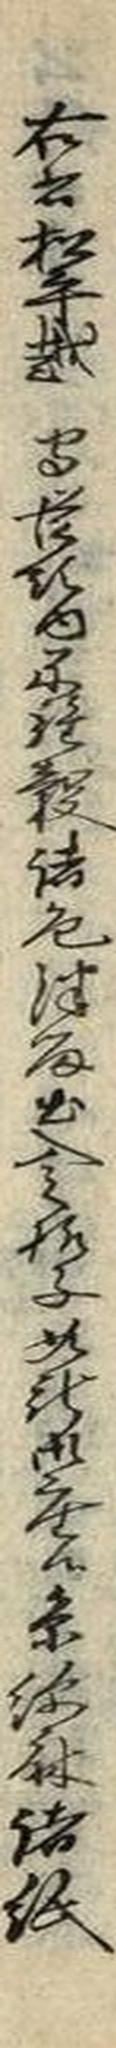右書松平越守従領内米雑穀諸色津留出入之様子如此御座候糸綿麻諸紙
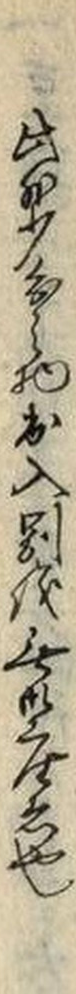此外少分之物出入別儀無御座者也
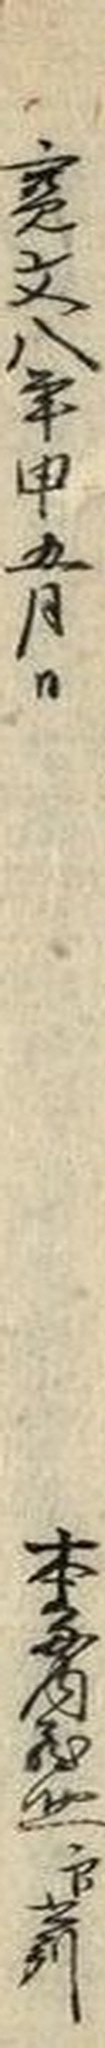寛文八年申五月日本多内蔵助印書判
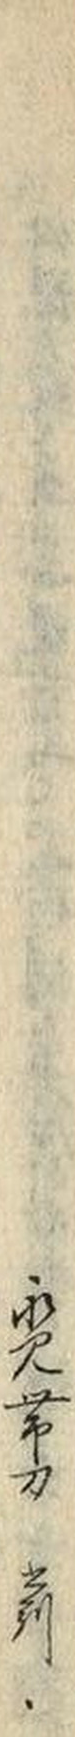永見帯刀書判
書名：御国他国諸事之部
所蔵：福井県文書館 Fukui Prefectural Archives
